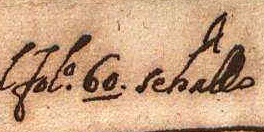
fol.o 60. se hallo
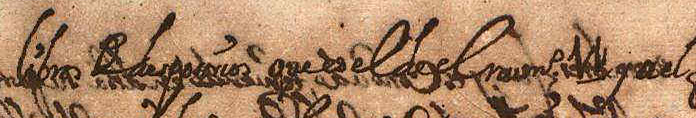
libros de desposorios que es el de el novm.o 11 y a el
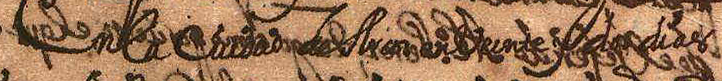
En la ciudad de Arcos en Veinte y dos dias
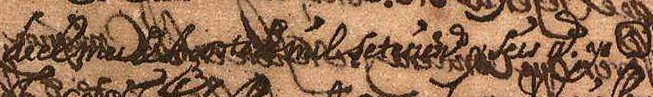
de el mes de Agosto de mil setecien.s y seis a.s yo D.n
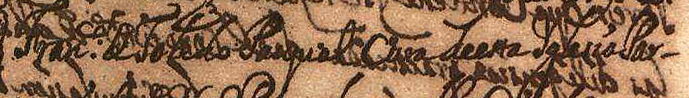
Fran.co de Toledo Pasqual Cura de esta Yglesia Par
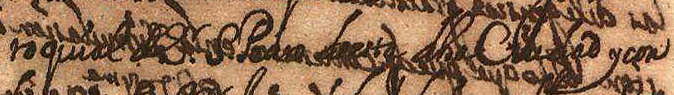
roquial de S.r S. Pedro de esta dha Ciudad y con
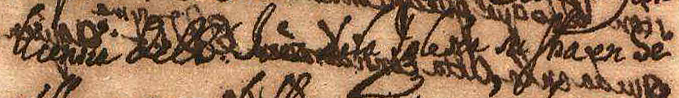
licensia del S.r Iuiz dela Yglesia su fha en Se
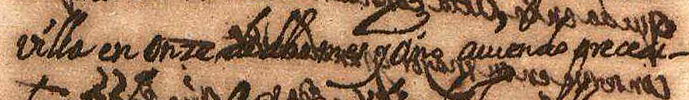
villa en onze de dho mes y año auiendo precedi
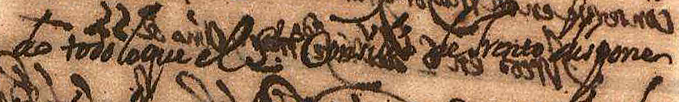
do todo lo que el S.to Consilio de Trento dispone
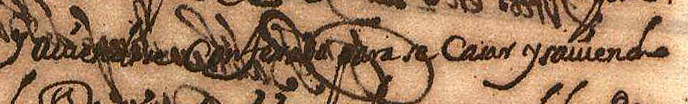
y auiendo de se confessar para se Casar y sauiendo
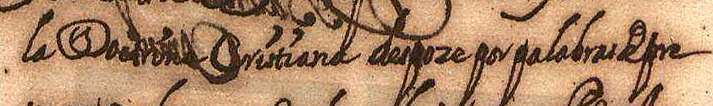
la Doctrina Cristana despoze por palabras de pre
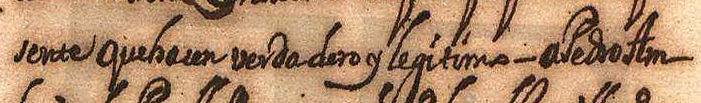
sente que hasen verdadero y legitimo – a Pedro Am
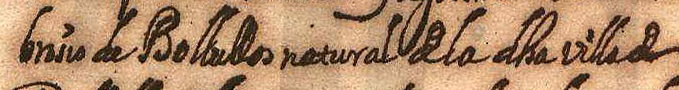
brosio de Bollullos natural de la dha villa de
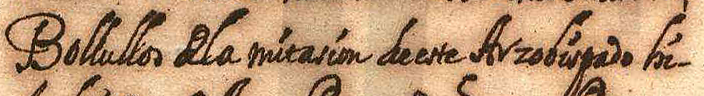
Bollullos de la mitasion de este Arzobispado hi
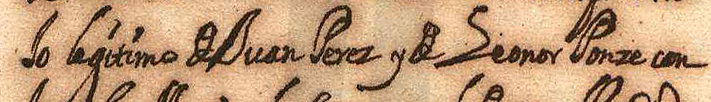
jo legitimo de Iuan Perez y de Leonor Ponze con
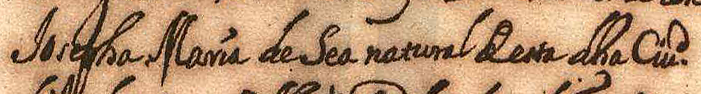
Iosepha Maria de Sea natural de esta dha Ciu.d
